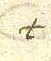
+
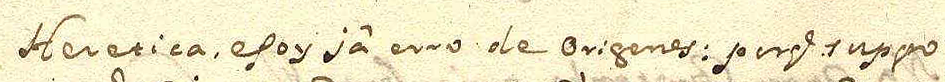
Heretica, e foy já erro de origenes: porq̄ suppo
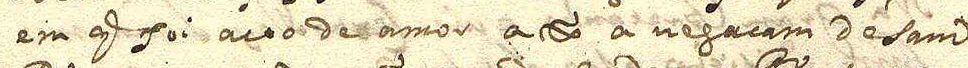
em q̄ foi acto de amor a xo a negaçam de sam
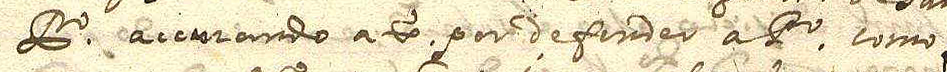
Po. accuzando a xo. por defender a Po, como
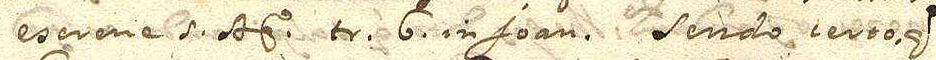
escreue s. Ag.o tr. 6. in Joan. sendo certo. q̄
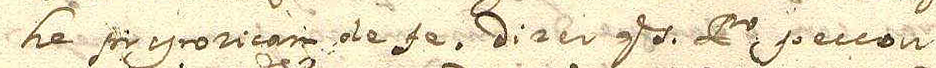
he preproziçam de fe. dizer q̄ s. Po peccou
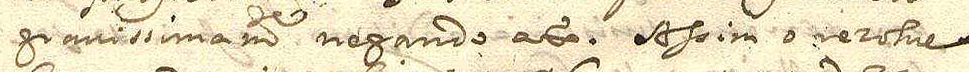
grauissimamte negando a xo. Assim o rezolue
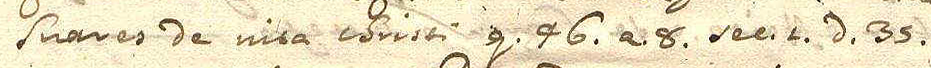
suares de uita christi q. 46. a. 8. sec. 1. d. 35.
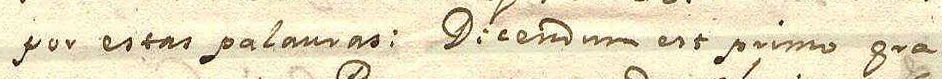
por estas palauras: Dicendum est primo gra
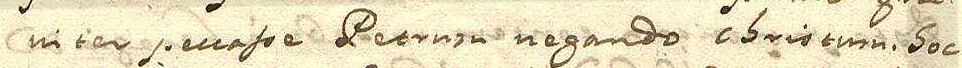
uiter pecasse Petrum negando christum. hoc
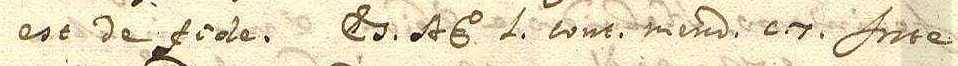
est de fide. E S. Ago 1 cont. mend. c.7. Jnte
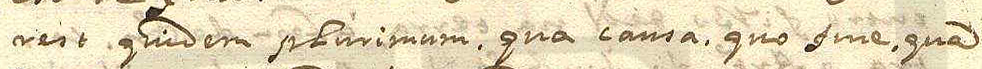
rest quidem plurimum, qua causa, quo fine, qua
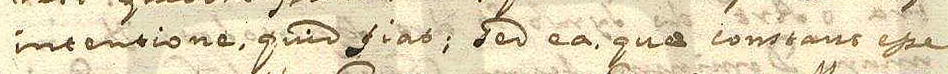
intentione, quid fias; sed ea, quæ constant esse
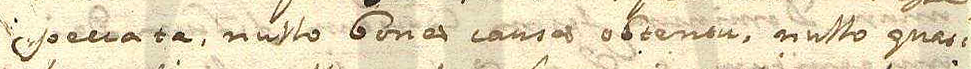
peccata, nullo bonas causas obtentu, nullo quasi
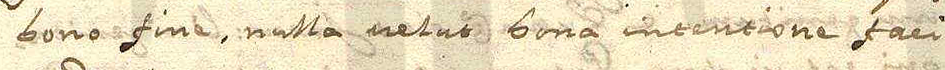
bono fine, nulla uelut bona intentione faci
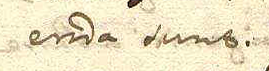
enda sunt.
